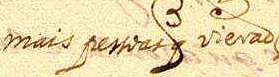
mais pessoas q̄ vieraõ
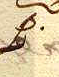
p.co
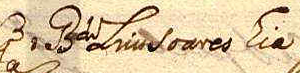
q̄ o Bdo Luis Soares hia
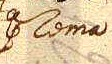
p̄a Roma
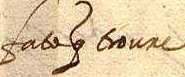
fato q̄ trouxe
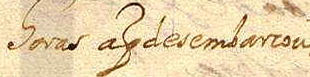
horas a q̄ desembarcou
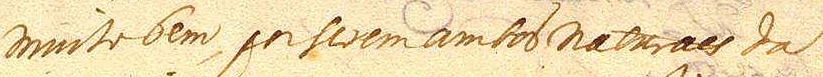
muito bem, por serem ambos naturaes da
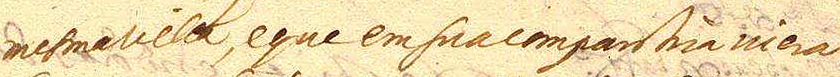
mesma uila, e que em sua companhia uiera
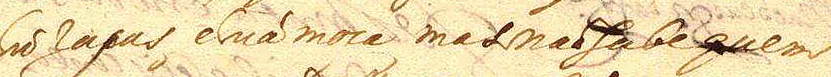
hū rapas, e huā moça mas naõ sabe quem
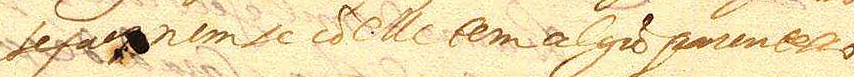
seja _ nem se cō elle tem algū parentesco
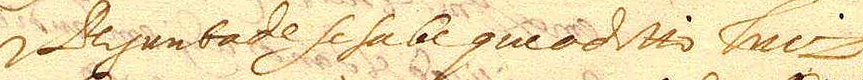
Perguntado se sabe que o ditto luiz
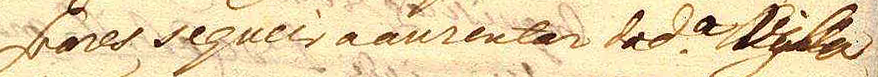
soares, se queira auzentar da d.a Villa
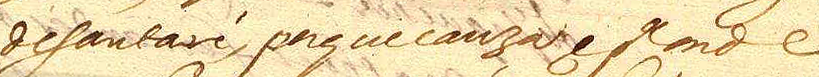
de santarē, porque cauza e pa onde
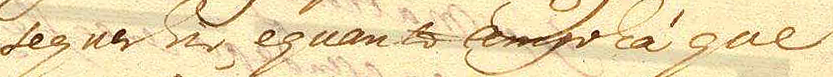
se quer hir, e quanto tempo há que
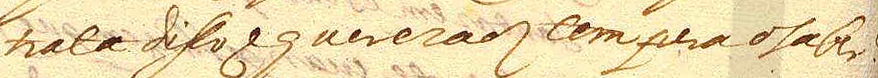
trata disso e que rezaõ tem pera o saber
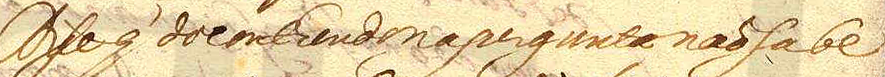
Disse q̄ do contheudo na pergunta naõ sabe
